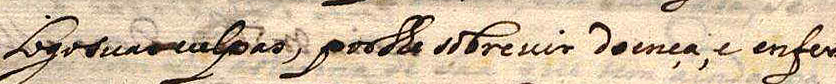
logo suas culpas, por lhe sobrevir doença e enfer
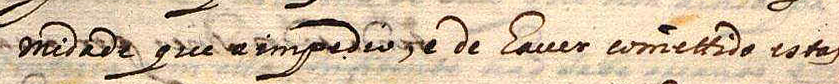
midade que a impediu, e de haver commetido estas
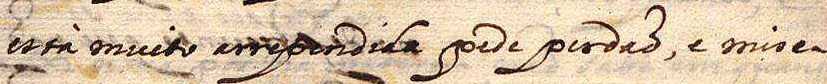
està muito arrependida pede perdaõ, e mise
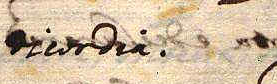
ricordia.
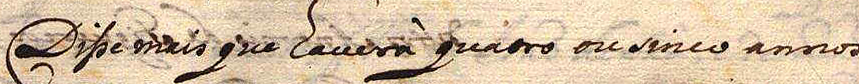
Disse mais que haverà quatro ou sinco annos
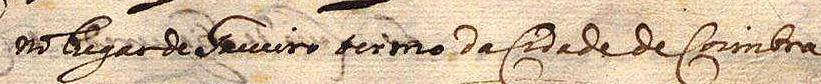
no lugar de Taveiro termo da Cidade de Coimbra
